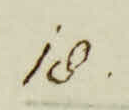18
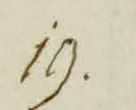19.
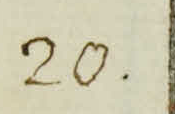20.
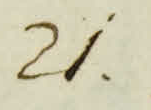21.
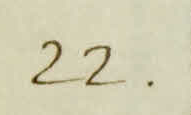22.
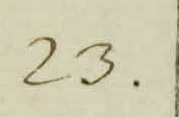23.
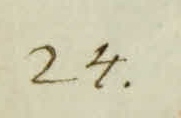24.
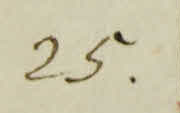25.
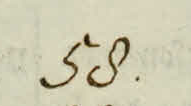58.
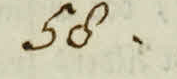58.
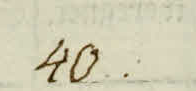40.
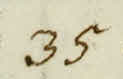35
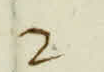2
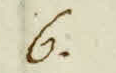6.
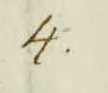4.
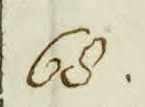68
